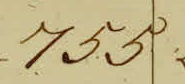755
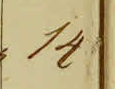14
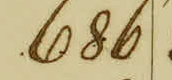686
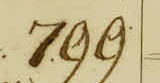799
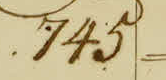745
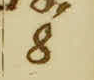8
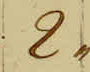2
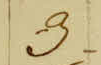3
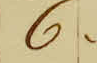6
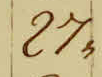27
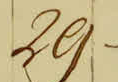29
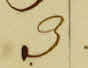3
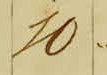10
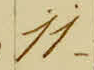11
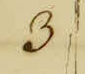3
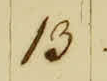13
